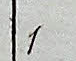1
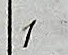1
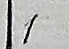1
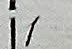1
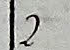2
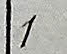1
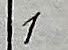1
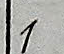1
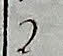2
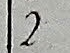2
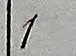1
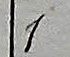1
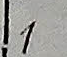1
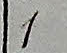1
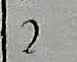2
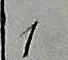1
